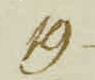19
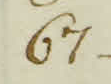67
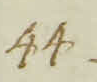44
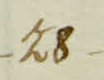28
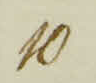10
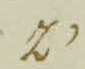2
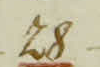28
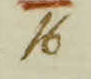16
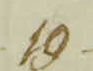19
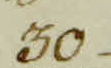30
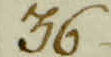36
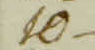10
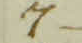7
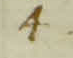4
